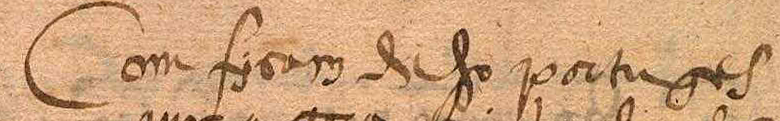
Comfisam de ho portuges
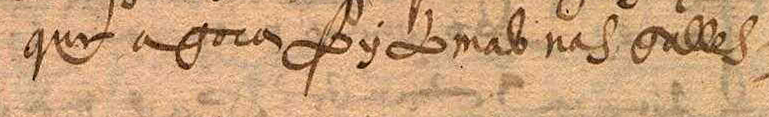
que agora foy tomado nas galles
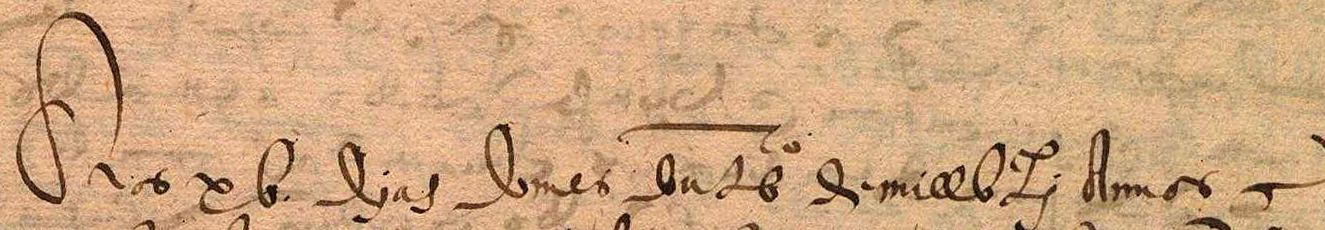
Aos xb. djas do mes doutbro de mill bcLj Annos ē
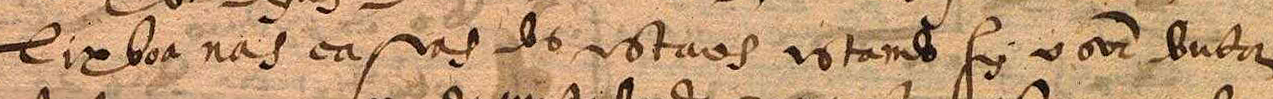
lixboa nas casas dos estaos estando hy o so̅r doutor
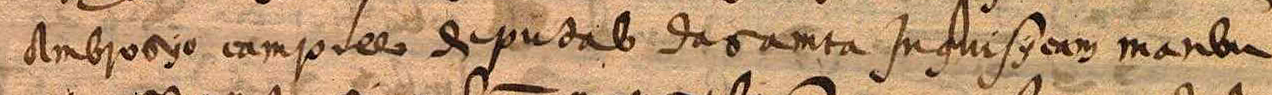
Ambrosyo campello deputado da samta Jnquisyçam mandou
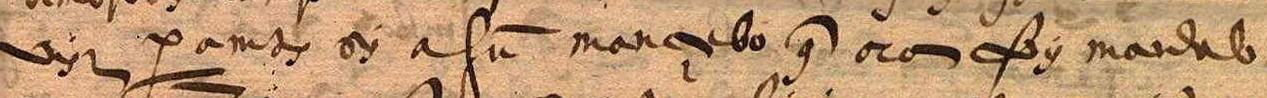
vyr ꝑamtꝭ sy a hū mancebo q̄ ora foy mandado
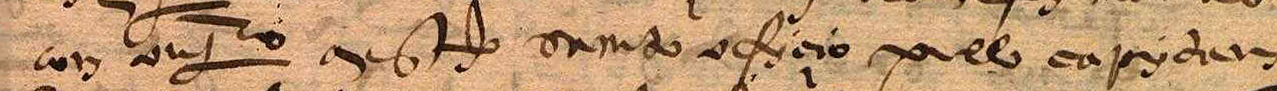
com outro a estꝭ samto ofycio pello capytam
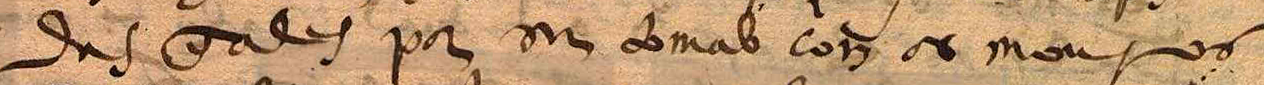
das gales por ser tomado com os mouros
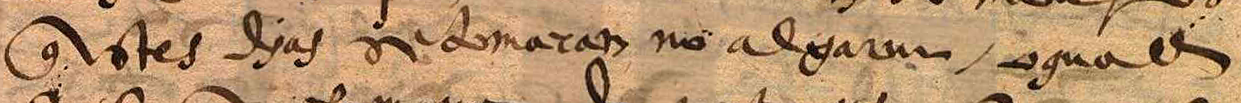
q̅ estes djas se tomaram no algarue / o quall
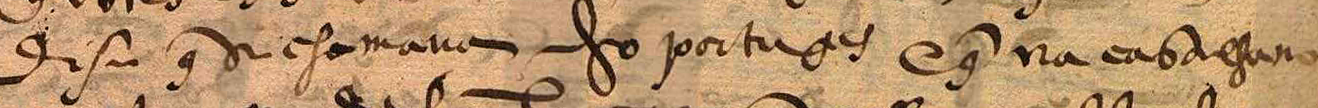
dise q̅ se chamaua djo portuges e q̅ era castelhano
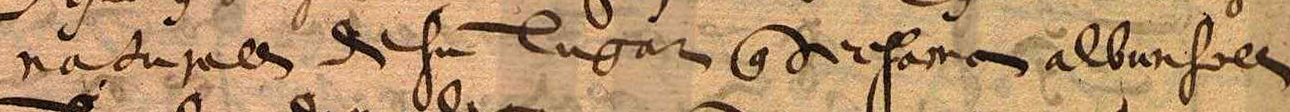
naturall de hu̅ lugar q̅ se chama albunholl
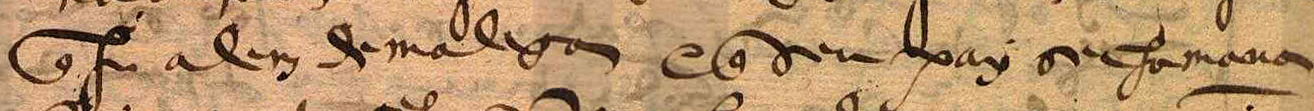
q̄ he alem de malega e q̅ seu pay se chamaua
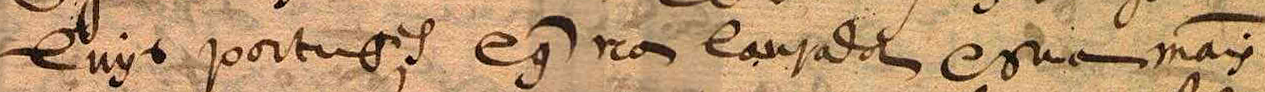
Luys portuges e q̅ era laurador e sua māy
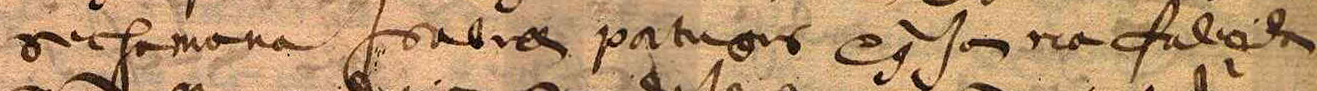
se chamaua Jsabell portuges e q̄ Ja era falecida
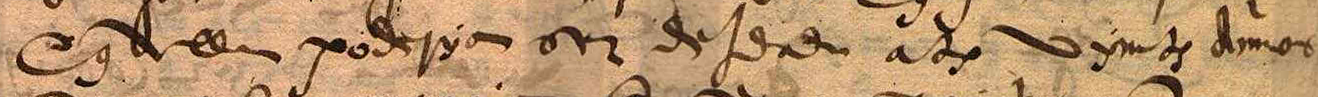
e q̅ elle poderya ser de Jdade atꝭ vymtꝭ Annos
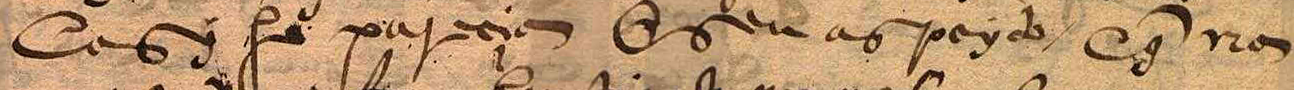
e asy ho parecia ē seu aspeyto / e q̅ era
